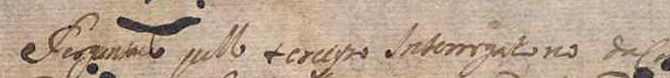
Perguntado pello terceyro Interrogatorio da C
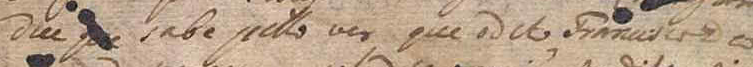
dice sabe pelo ver que o dito Francisco de o
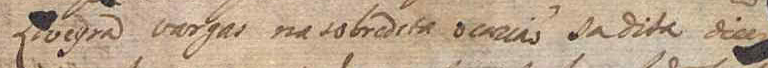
Liveyra vargas na sobredita ocaziaõ ia dita dice
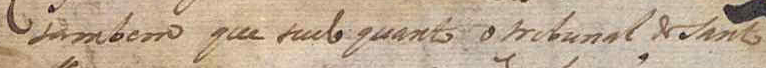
tambem que tudo quanto o tribunal do Santo
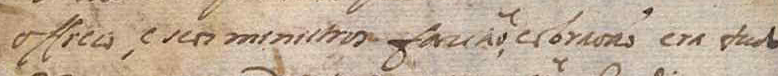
officio, e seos ministros faziaõ, e obravão era tudo
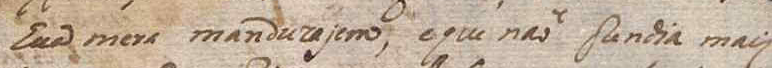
huā mera manduzajem, e que naõ pRendia mais
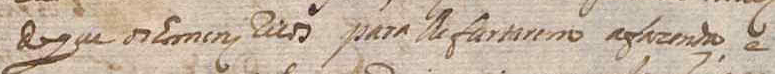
do que os homens Ricos para de fartarem a fazenda, e
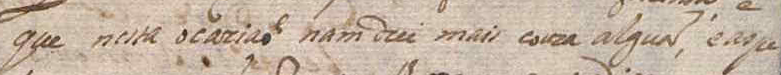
que nesta ocaziaõ nam dice mais couza alguā, e as pe
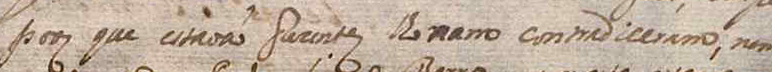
ssoas que estavaõ pRezentes lho nam contradiceram, nem
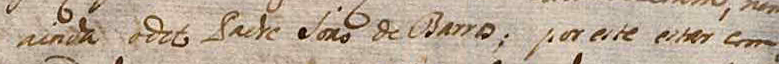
ainda o dito Padre Ioaõ de Barros; por este estar com
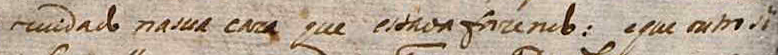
o cuidado na sua caza que estava fazendo: e que outrosi
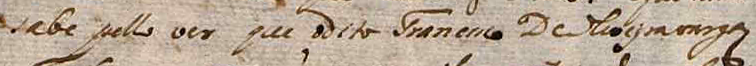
sabe pello ver que o dito Francisco De Olivejra vargas
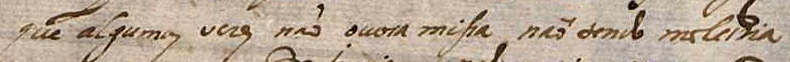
que algumas vezes naõ ouvia missa, naõ tendo molestia
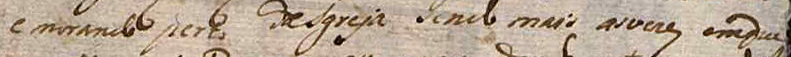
e morando perto da Igreja sendo mais as vezes em que
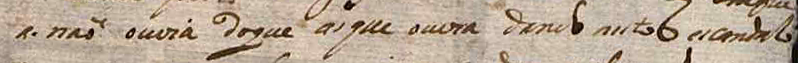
a. naõ ouvia do que as que ouvia dando auto escondalo
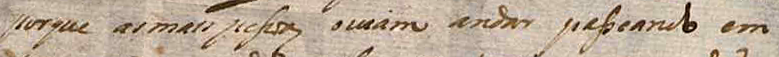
porque as mais pessoas o uiam andar passeando em
